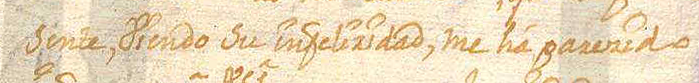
sente, Viendo su infelizidad, me há parezido
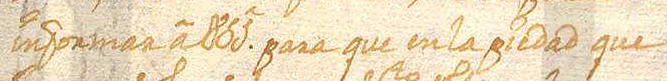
informar â VSI. para que en la piedad que
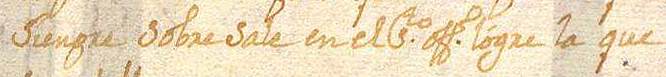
Sienpre Sobresale en el s.to off.o lógre la que
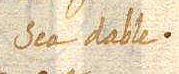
Sea dable.
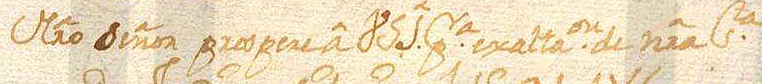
Nr̄o Señor prospere â VSI. p.ra exalta.on de nr̄a s.ta
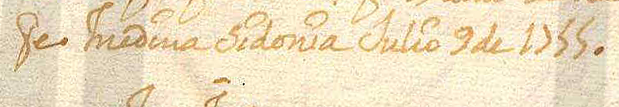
fe. Medina Sidonia Iulio 9 de 1755.
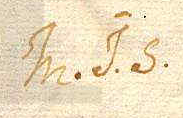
M. I. S.
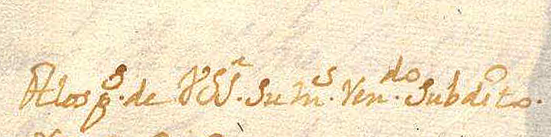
A los p.s de VSI. Su m.s Reu.do Subdito.
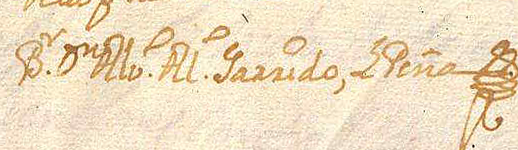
B.r D.n Alv.o Al.o Garrido, Y Peña
